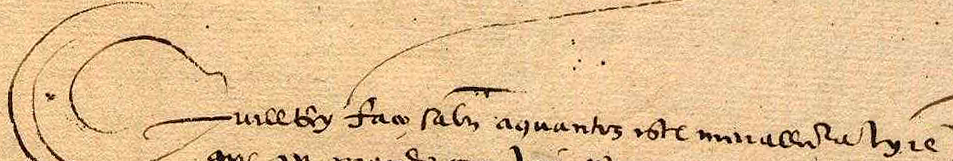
Eu ell Rey faço sab̄r a quantos este meu allura vyrē
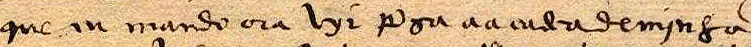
que eu mando ora vyr p̄sa aa cadea de mjnha
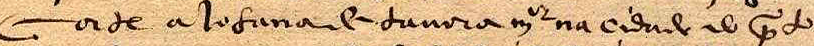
Corte a Iohana de tauora mor na cidade do p̄oto
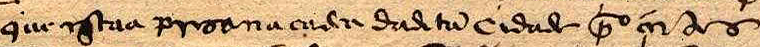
que estaa presa na cadea da dita Cidade p̄o certos
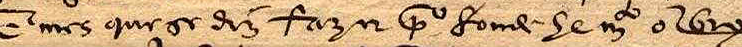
cimes que se diz fazer p̄o honde he mto obry
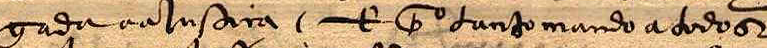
gada aa Iustiça / E p̄otanto mando a todos
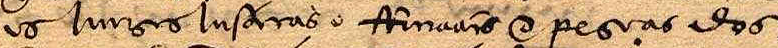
os Iuizes Iustiças oficiaaes e pesoas dos
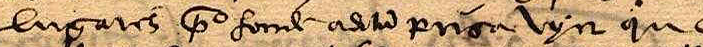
lugares p̄o honde a ditā presa vyer que
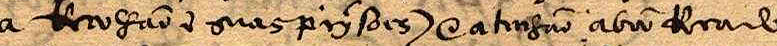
a Recolhaõ ē suas prysões e a tenhão a boō Recado
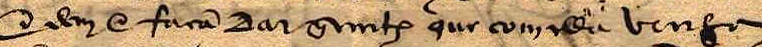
e dem e façā dar gente que com ella venha
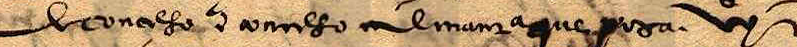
de concelho ē concelho de manra que posa vyr
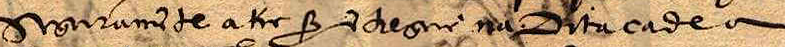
seguramēte atee ꞩ ētregue na Dita cadea
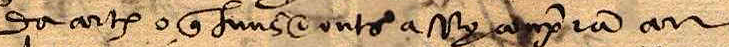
da cortꝭ o q̄ huus̄ e outos assy comp̄rā com
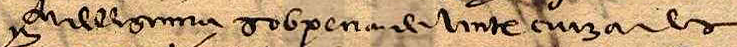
mta delligencia sob pena de vinte cuzados
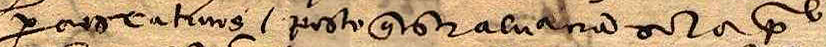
ꝑa os catiuos / posto q̄ este alua nā seja pdo
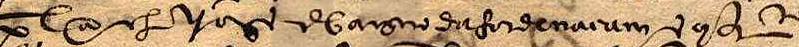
p̄la chrjā sē ēbarguo da hordenaçam ē ꝯtrro
